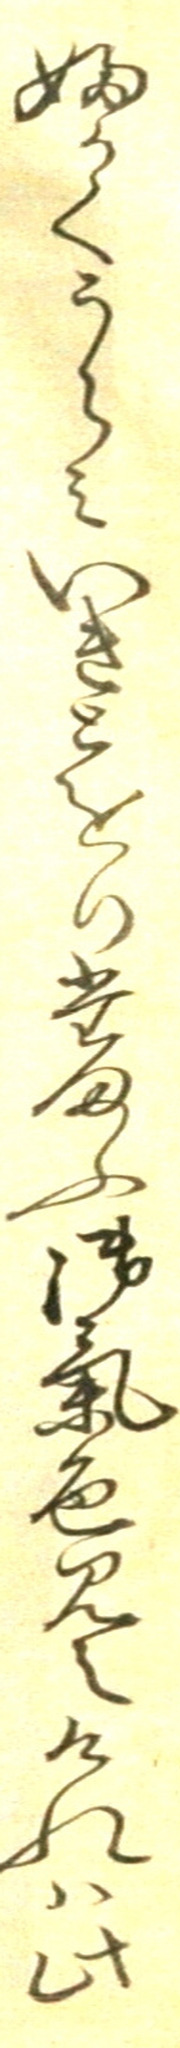ふかくうらみいきとをりたまふ御気色見へけれは此
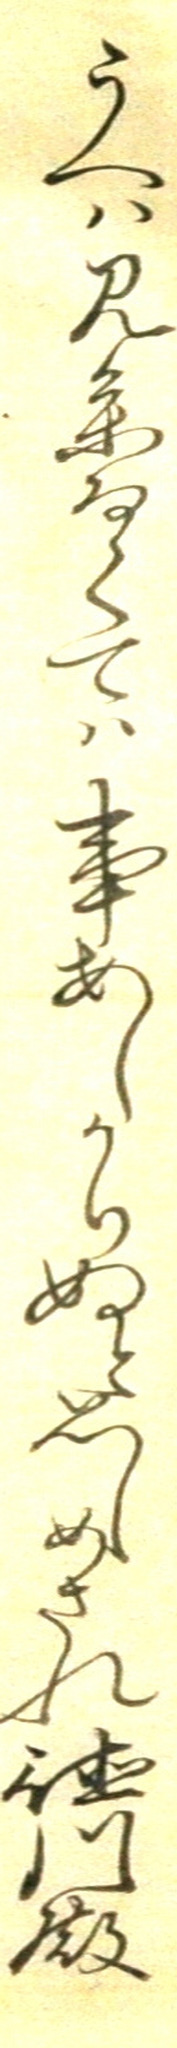うへは見参なくては事あしからぬと思しめされ徳川殿
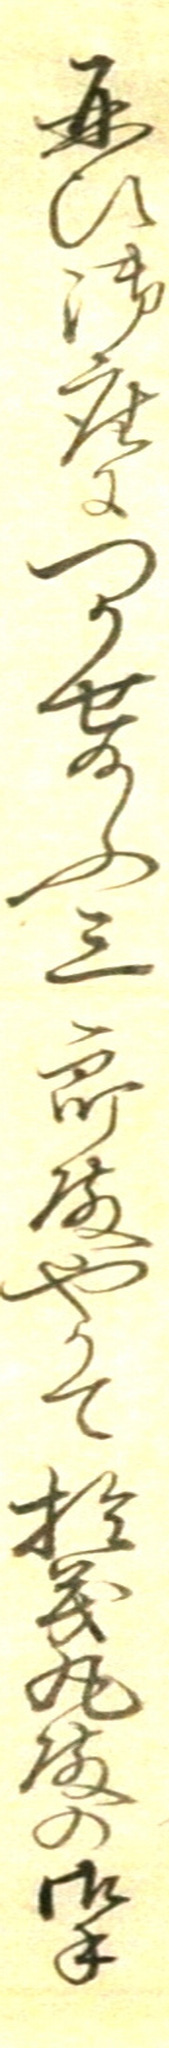再ひ御座につかせ給ふ三郎殿やかて於義丸殿の御手
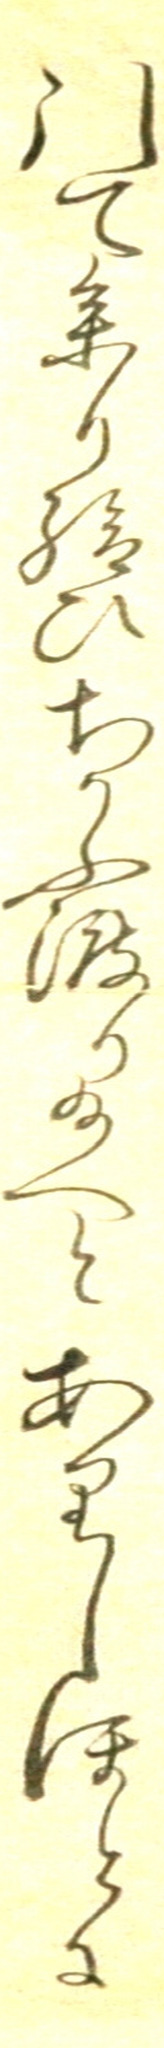引て参り給ひちかふ渡り給へとありしほとに
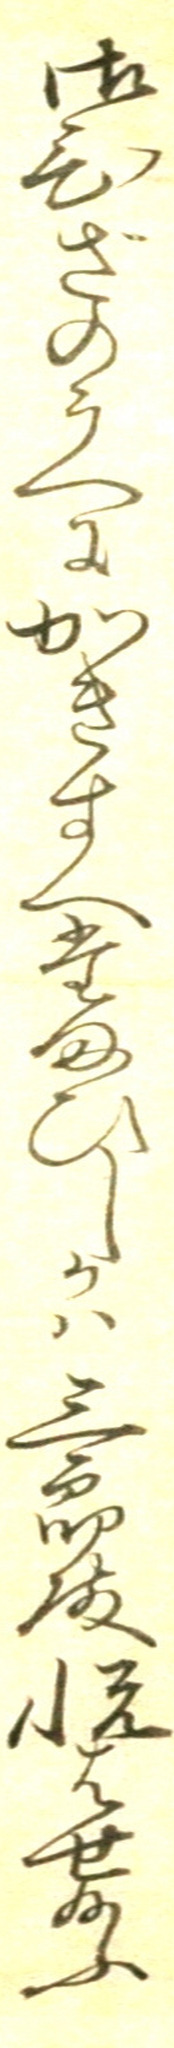御ひざのうへにかきすへたまひしかは三郎殿悦はせ給ふ
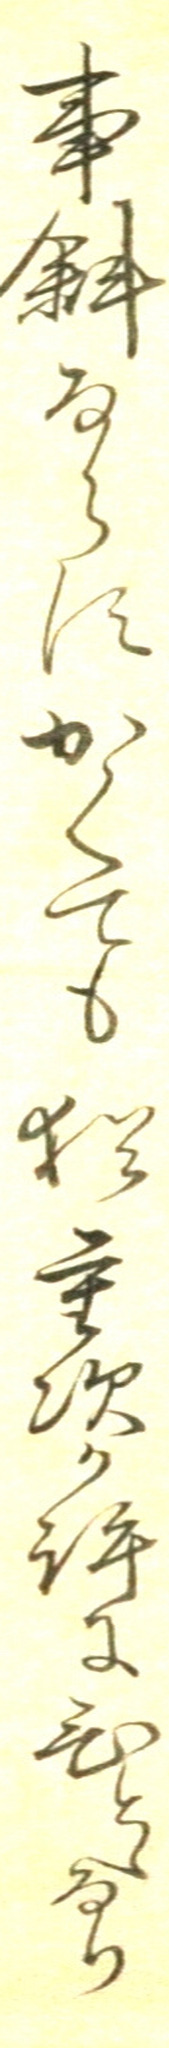事斜ならすかくても猶重次か許にひとゝなり
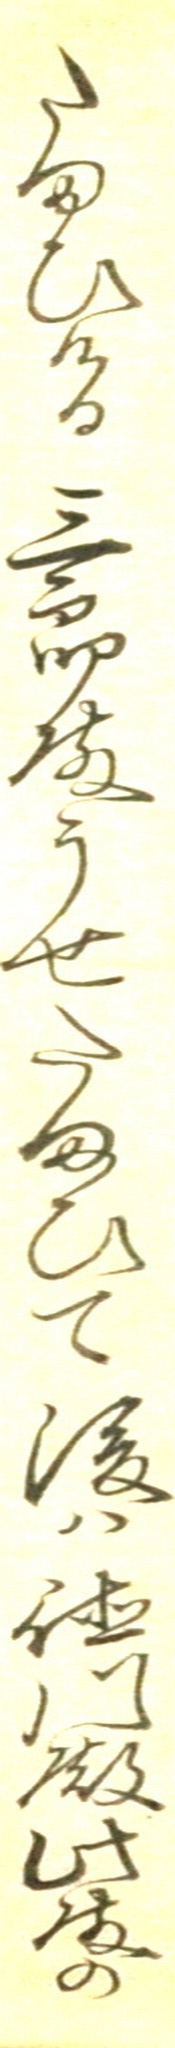たまひける三郎殿うせたまひて後は徳川殿此殿の
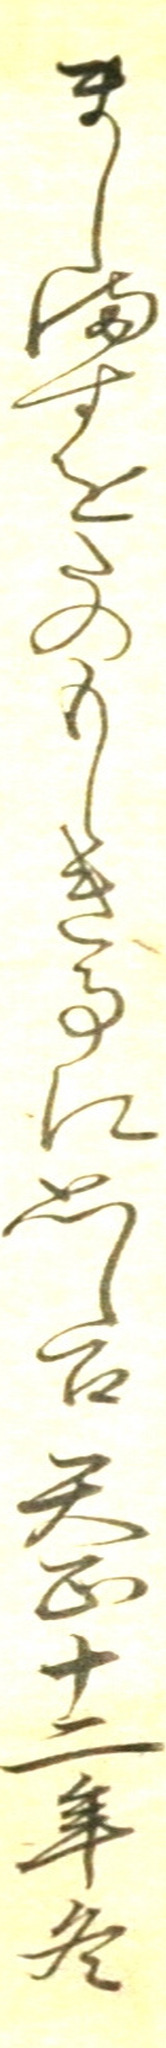ましますをたのもしき事に思し召天正十二年冬
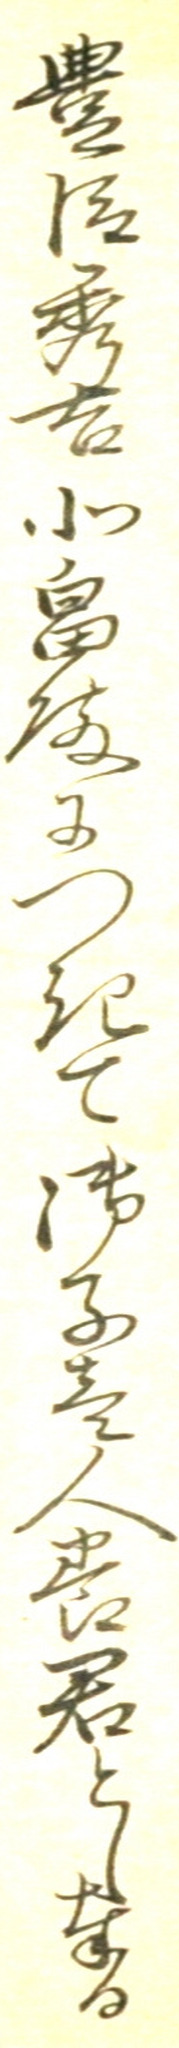豊臣秀吉北畠殿につきて御子壱人養君とし奉る
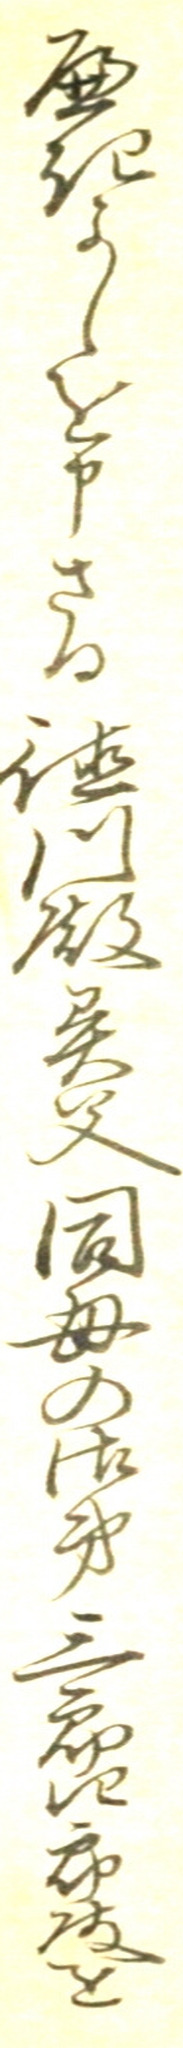へきよしを申さる徳川殿異父同母の御弟三郎四郎殿を
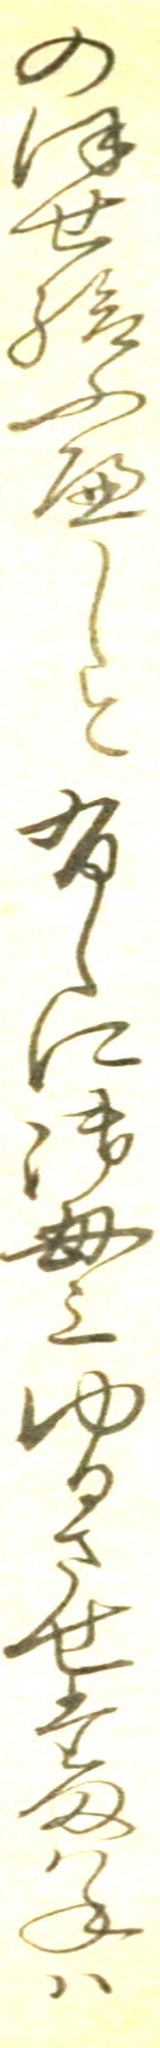のほせ給ふへしと有しに御母上ゆるさせたまはねは
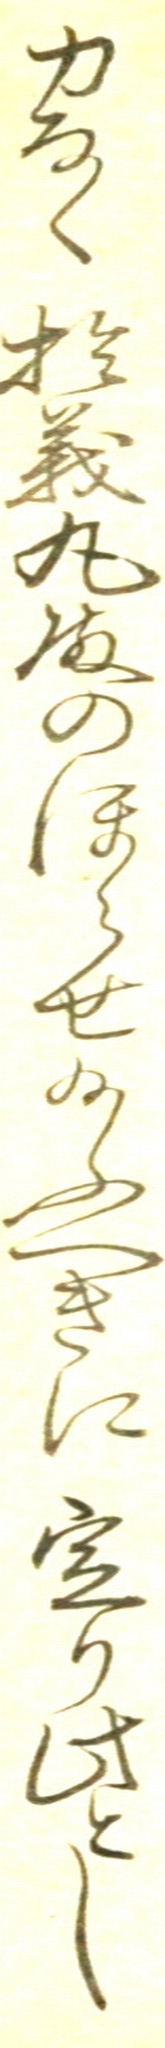力なく於義丸殿のほらせ給ふへきに定り此とし
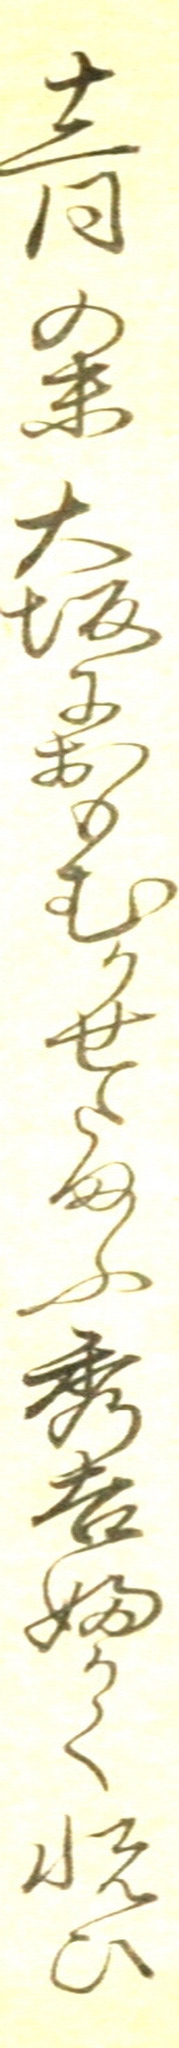十二月の末大坂におもむかせたまふ秀吉ふかく悦ひ
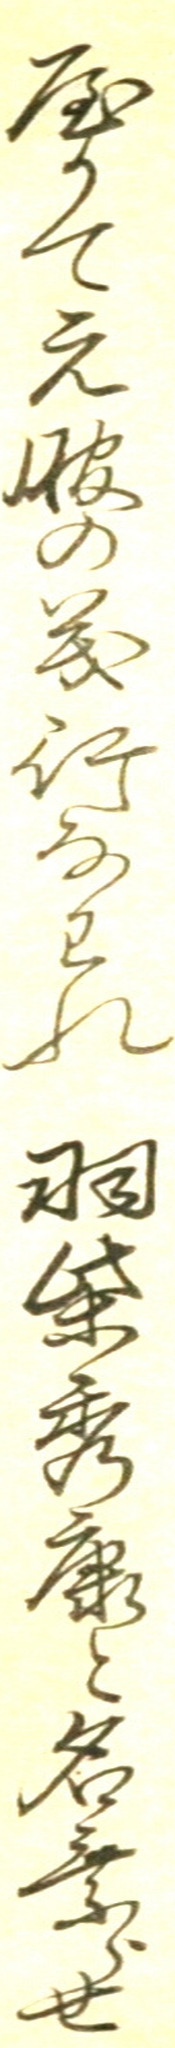やかて元服の義行なわれ羽柴秀康と名乗らせ
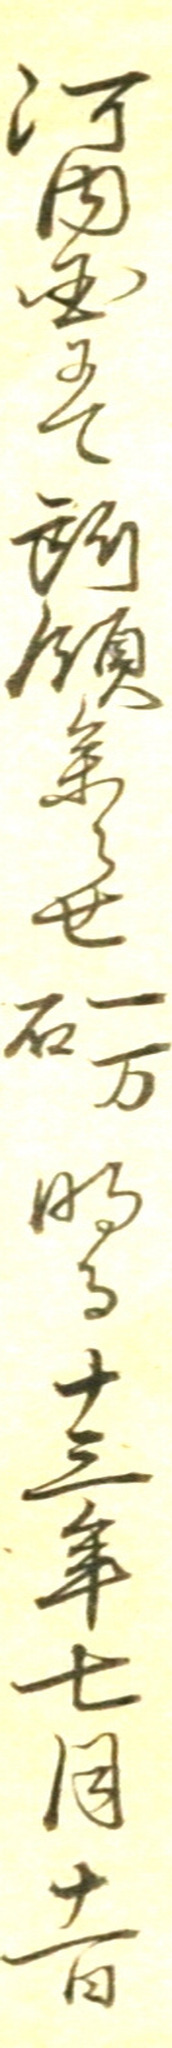河内国にて所領参らせ一万石明る十三年七月十一日
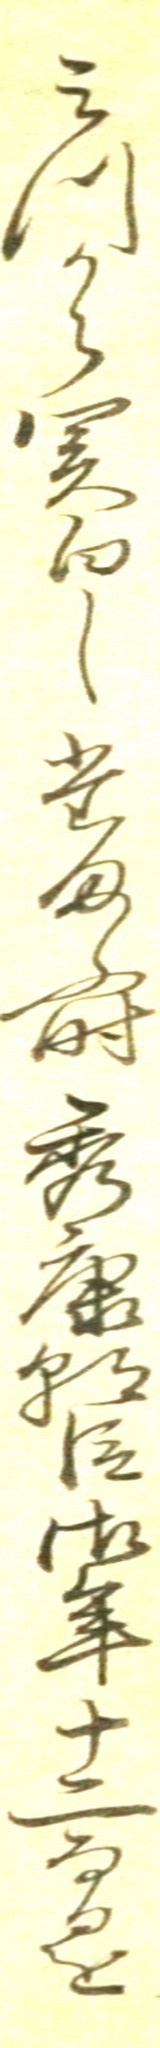みつから関白したまふ時秀康朝臣御年十二なるを
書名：藩翰譜（一）
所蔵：伊那市立高遠町図書館・合同会社AMANE
